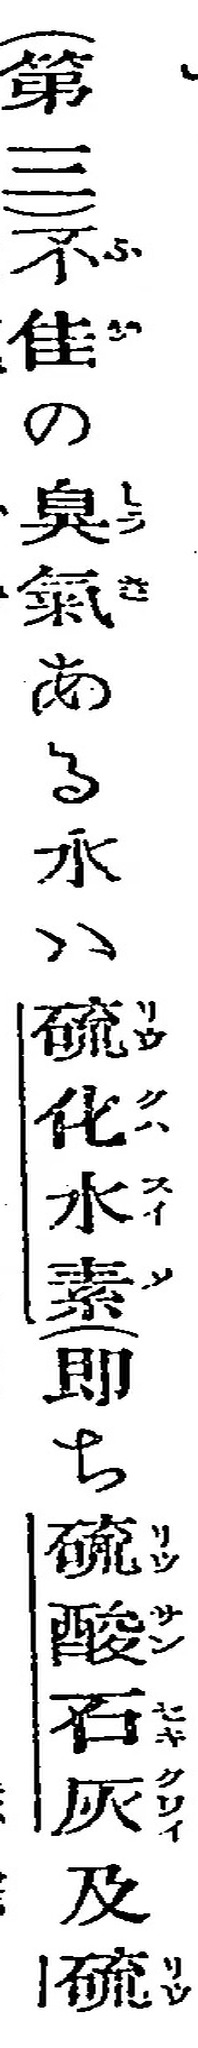[第三]不佳の臭気ある水は硫化水素[即ち硫酸石灰及硫
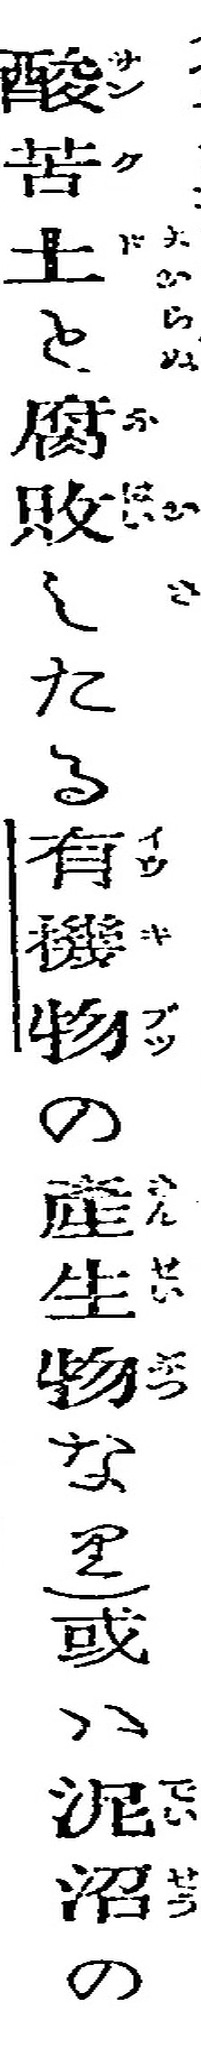酸苦土と腐敗したる有機物の産生物（さんせいぶつ
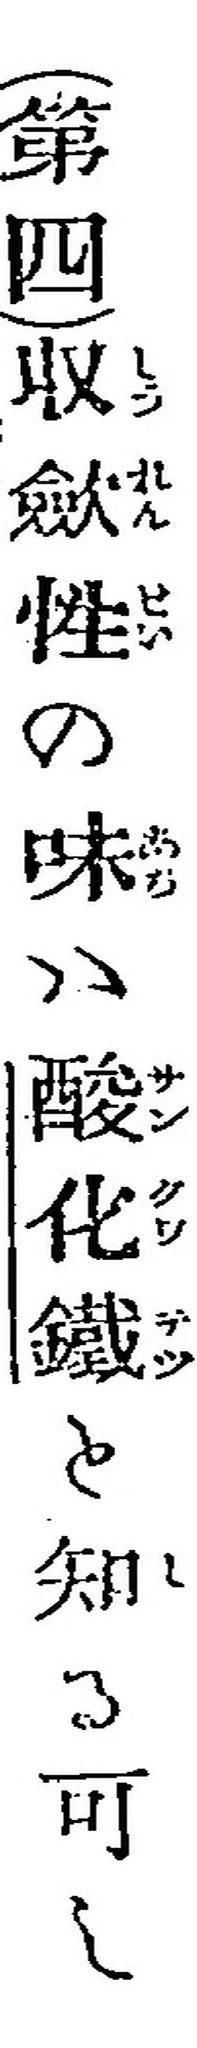[第四]収斂性の味は酸化鐵と知る可し
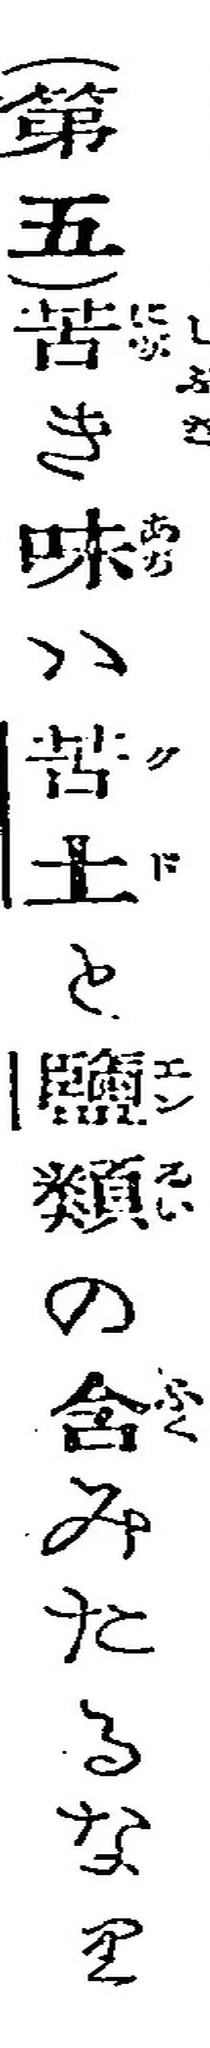[第五]苦き味は苦土と鹽類の(含みたるなり
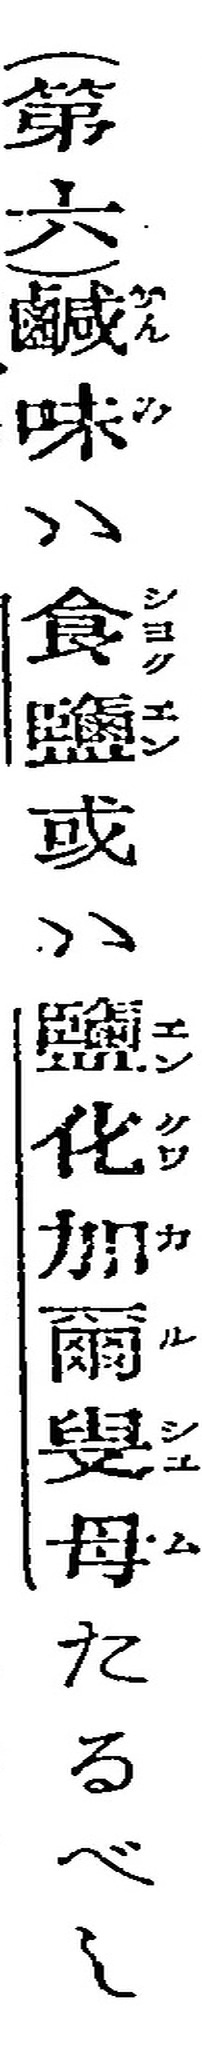[第六]鹹味は食鹽或は鹽化加爾叟母たるべし
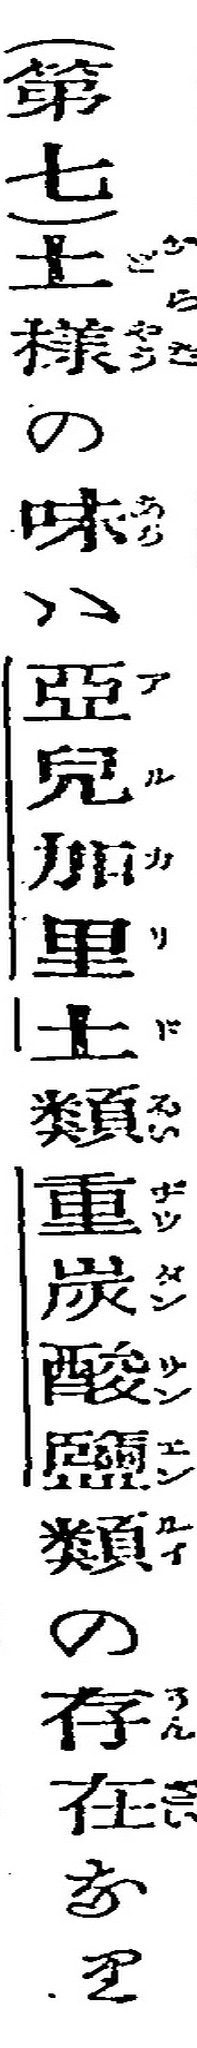[第七]土様の味は亞兒加里土類重炭酸鹽類の存在なり
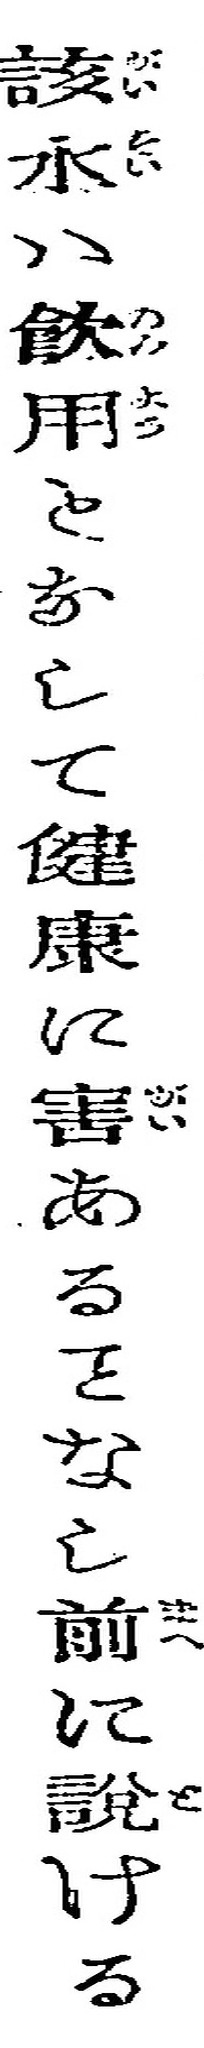該水は飲用となして健康に害あることなし前に説ける
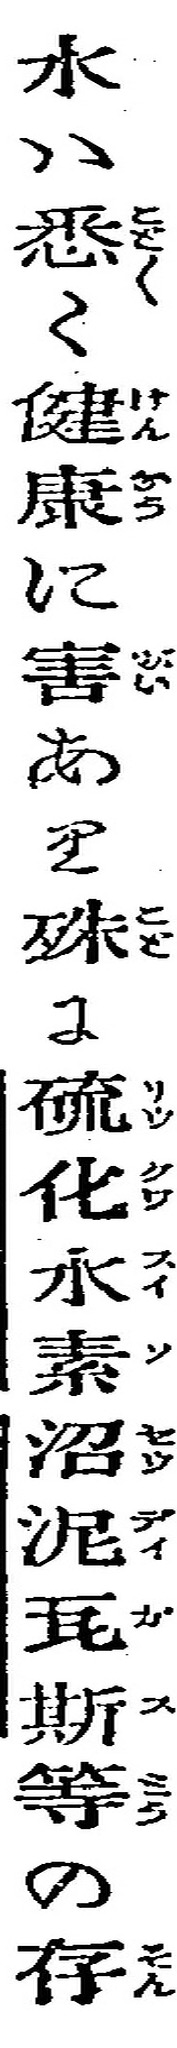水は悉々く健康に害あり殊に硫化水素沼泥瓦斯等の存
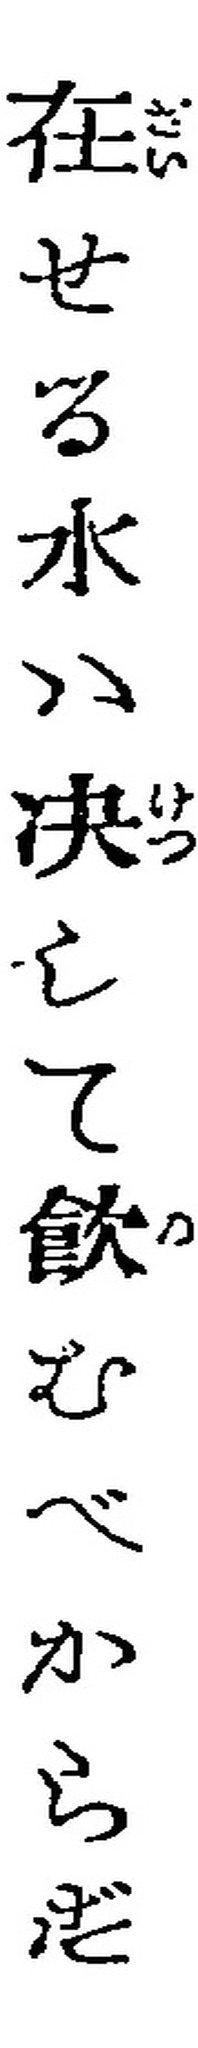在せる水は決して飲むべからず
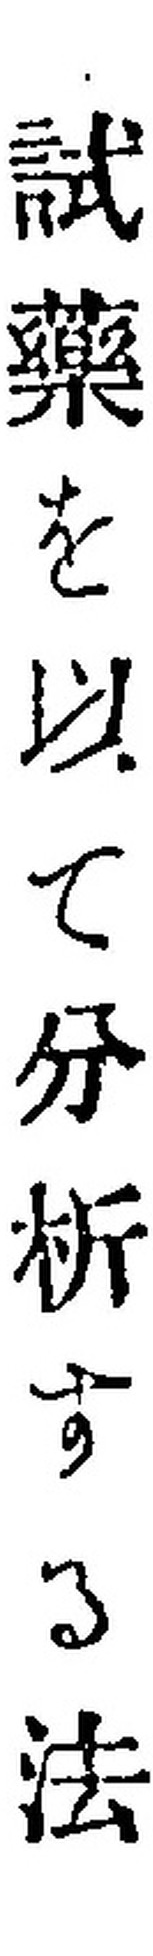試薬を以て分析する法
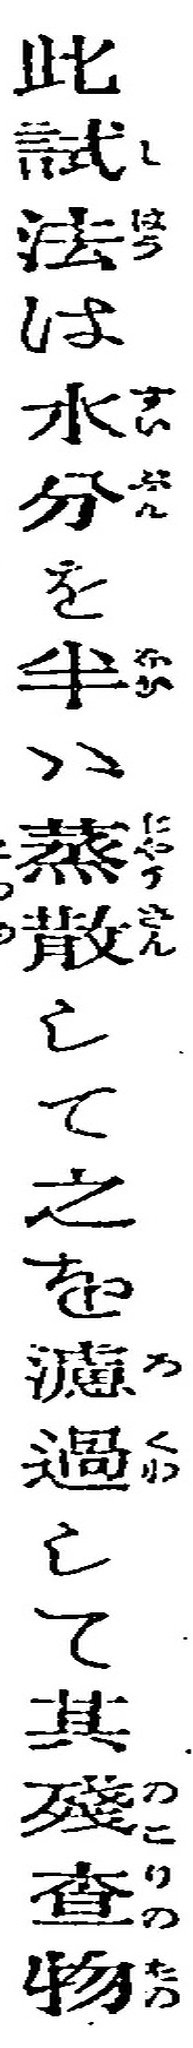此試法は水分を半は蒸散して之を濾過して其残査物
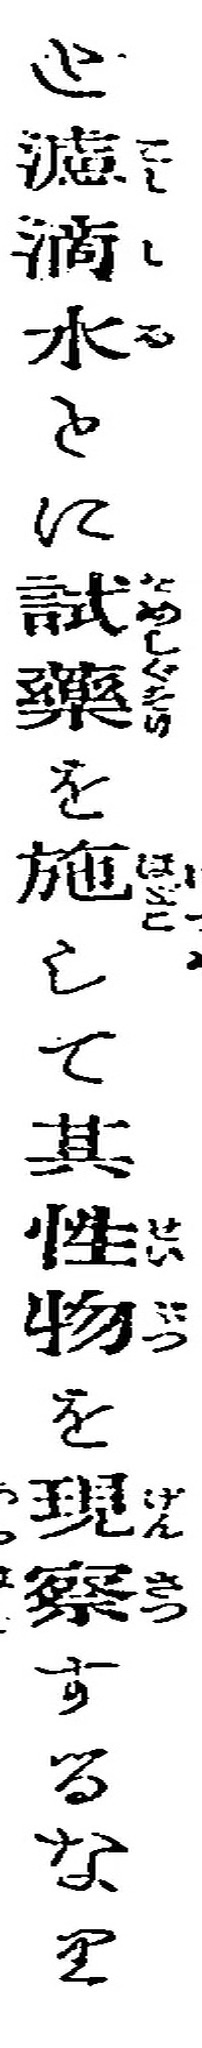と濾滴水とに試薬を施して其性物を減察するなり
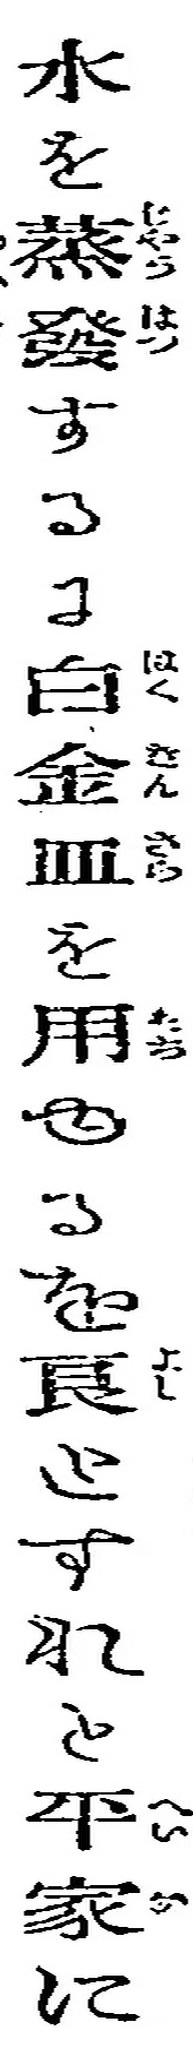水を蒸発するに白金皿を用ゆるを良とすれと平家に
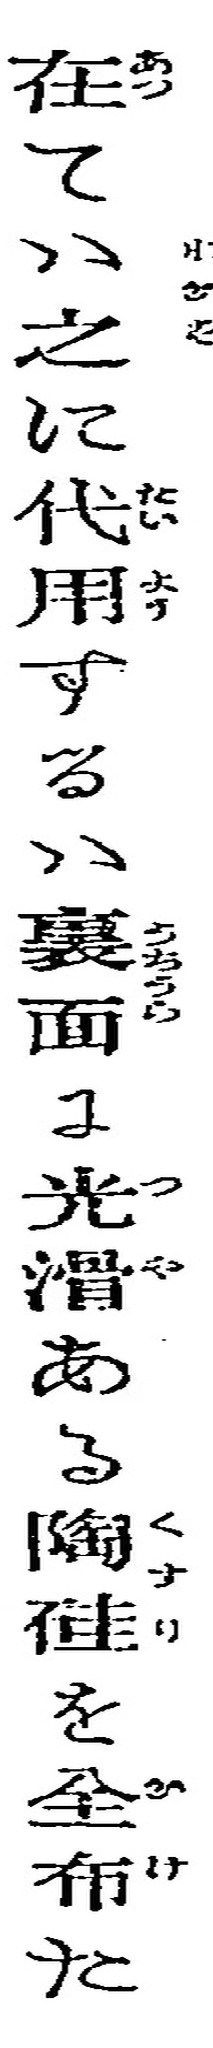在ては之に代用するは裏面に光滑ある陶硅を全布た
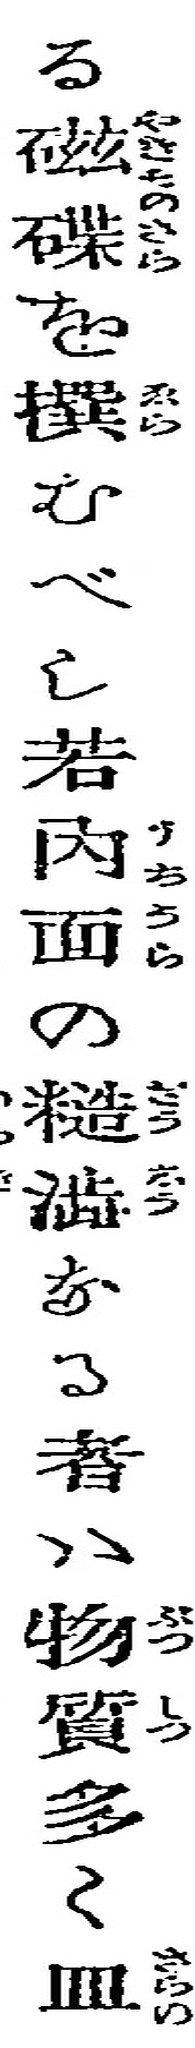る磁碟を撰むべし若内面の糙澁なる者は物質多く皿
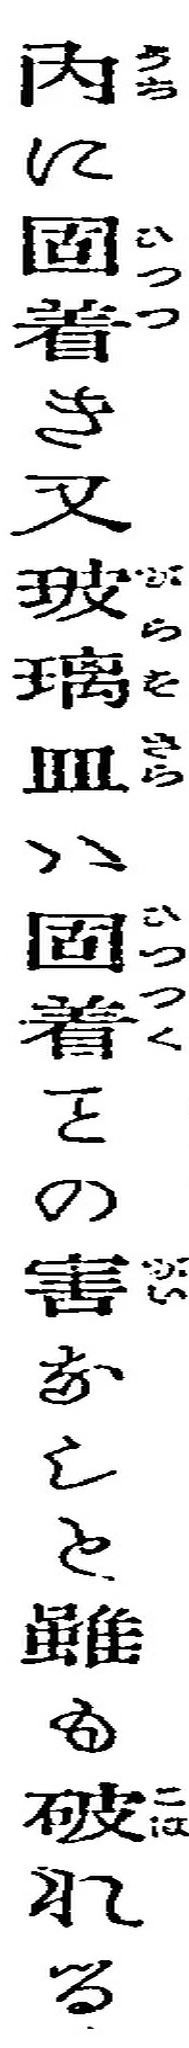内に固着き又玻璃皿は固着ことの害なしと雖も破れる
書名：飲水の心得 : 伝染病の予防
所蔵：国立国会図書館 National Diet Library, JAPAN
